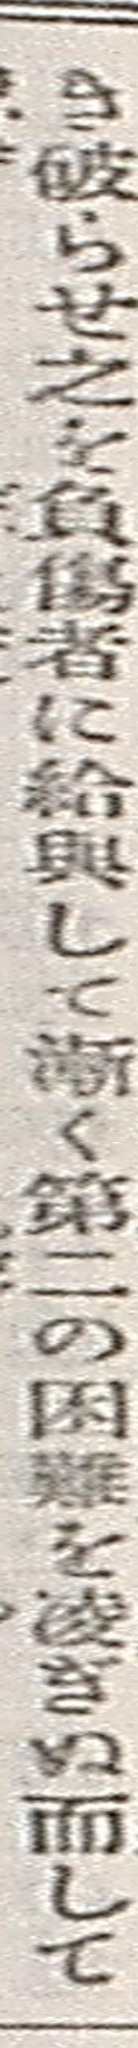き破らせ之を負傷者に給与して漸く第二の困難を凌ぎ而して
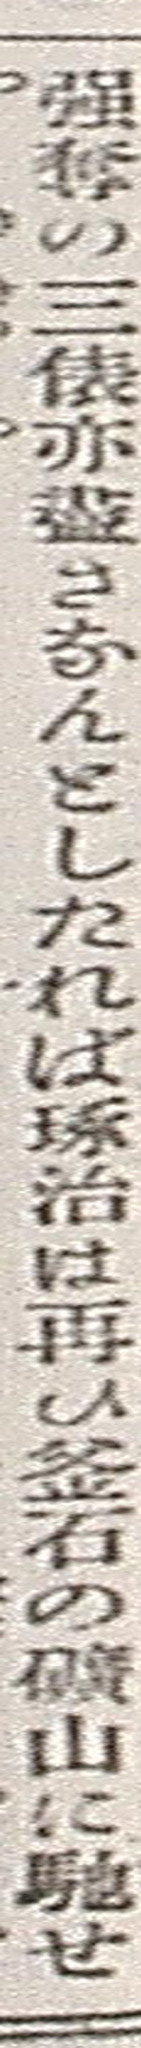強奪の三俵亦尽きなんとしたれば琢治は再び釜石の鉱山に馳せ
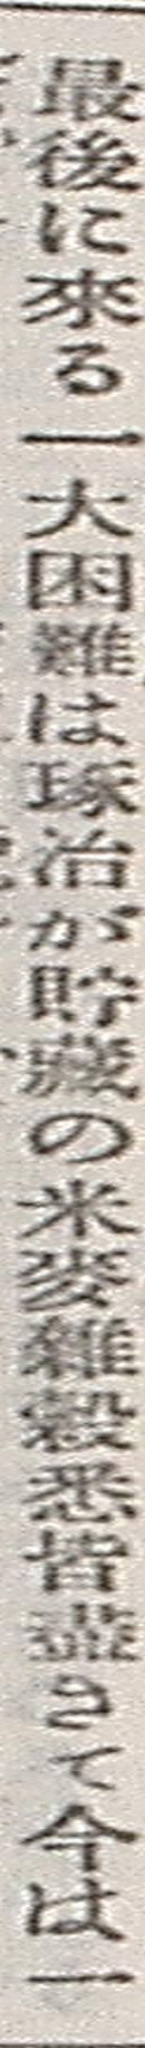最後に来る一大困難は琢治が貯蔵の米麦雑穀悉皆尽きて今は一
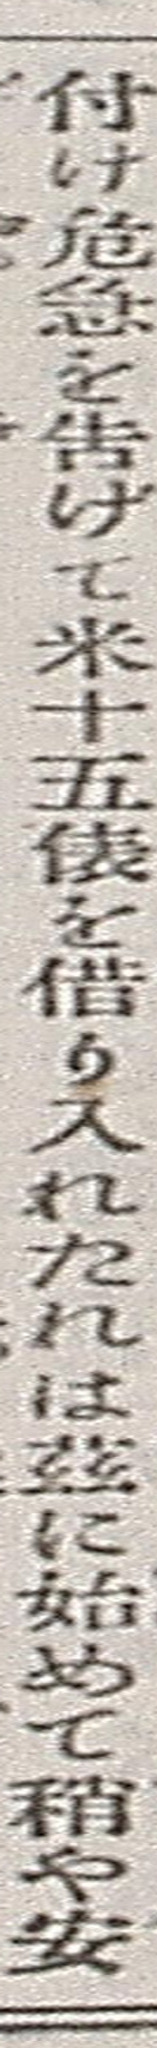付け危急を告げて米十五俵を借り入れたれは茲に始めて稍や安
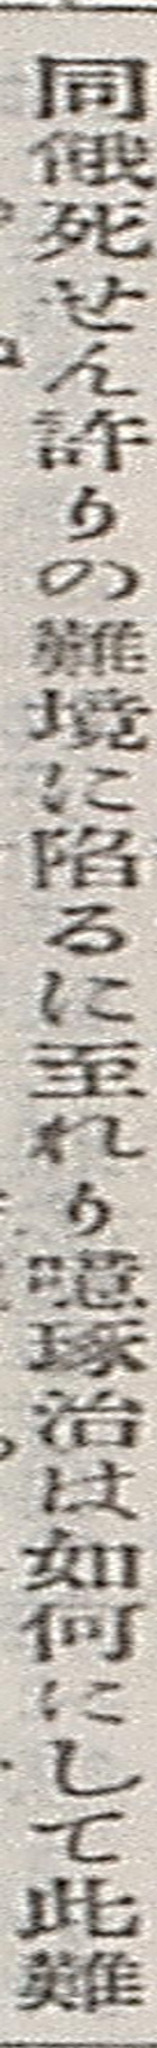同餓死せん許りの難境に陥るに至れり噫琢治は如何にして此難
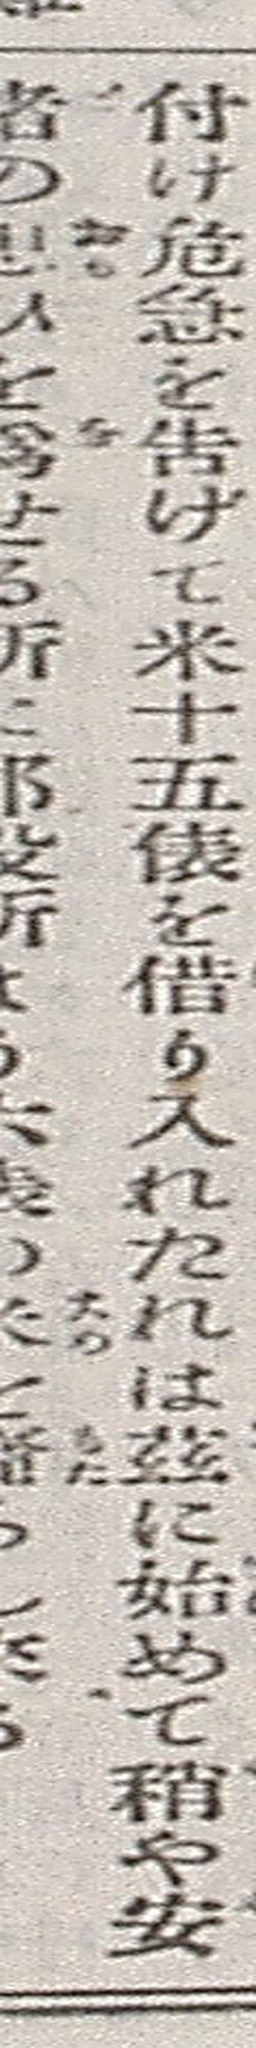堵の思ひを為せる所に郡役所より六俵の米を齎らし来る
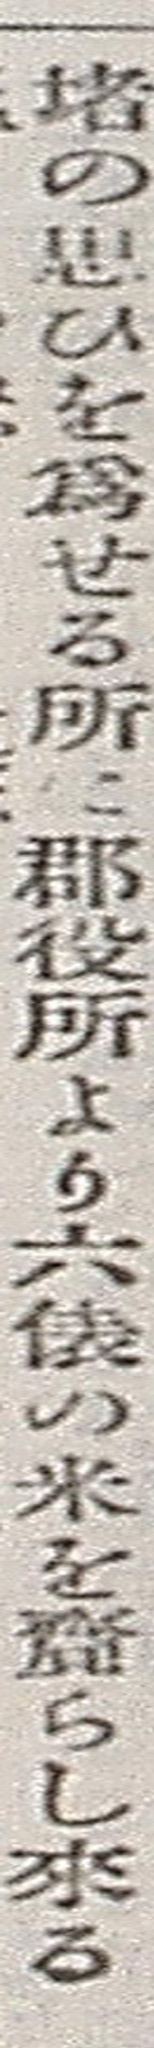堵の思ひを為せる所に郡役所より六俵の米を齎らし来る
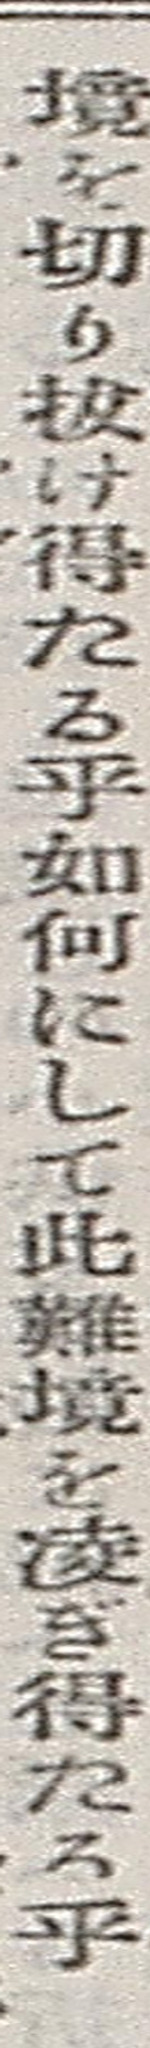境を切り抜け得たる乎如何にして此難境を凌ぎ得たる乎
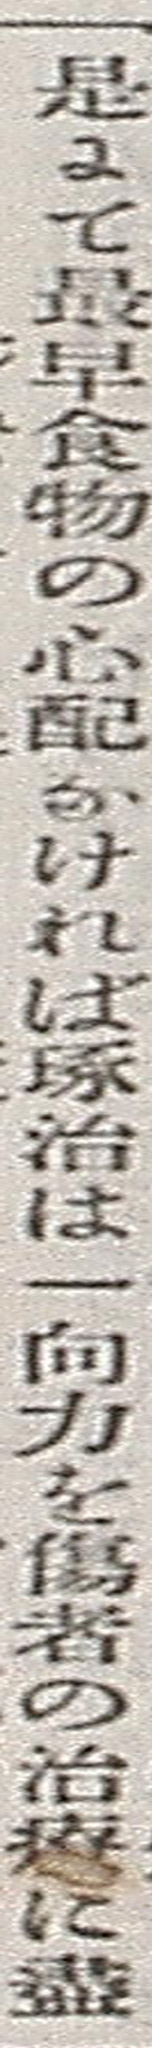是にて最早食物の心配なければ琢治は一向力を傷者の治療に尽
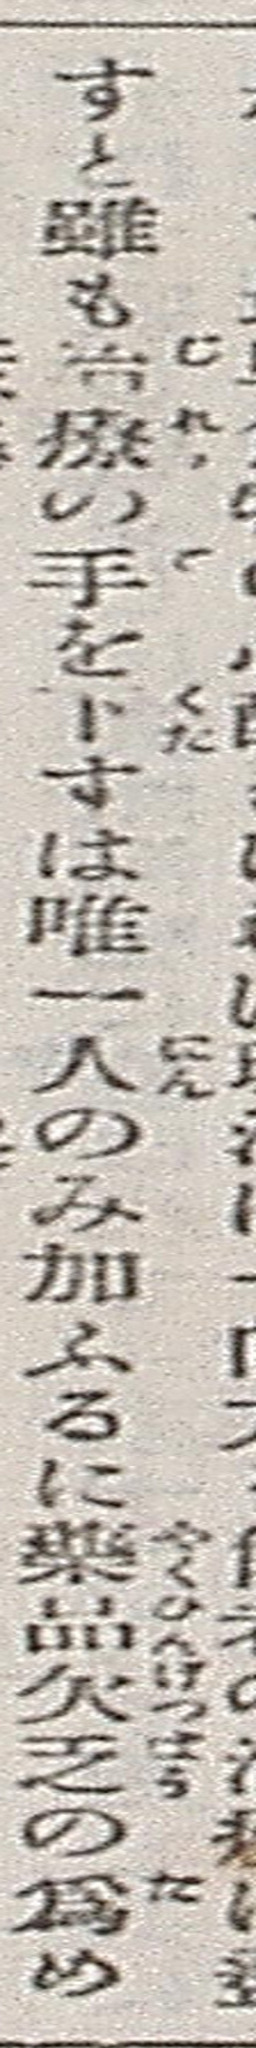すと雖も治療の手を下すは唯一人のみ加ふるに薬品欠乏の為め
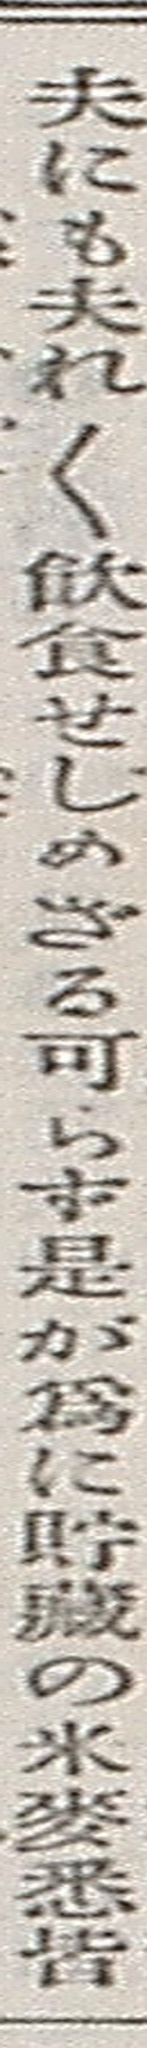夫にも夫れ〳〵飲食せしめざる可らず是が為に貯蔵の米麦悉皆
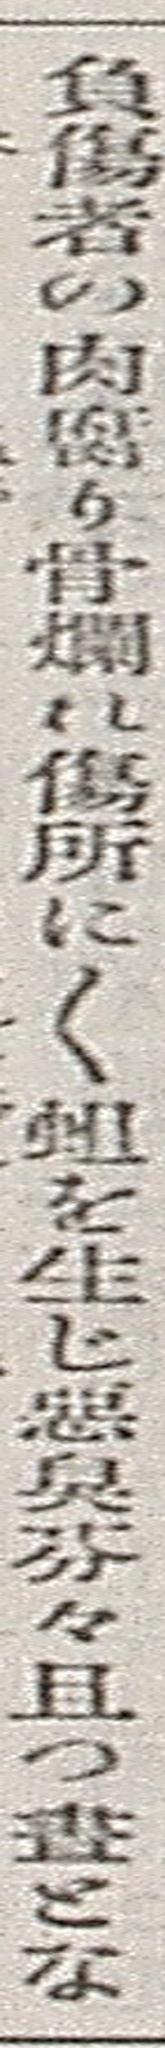負傷者の肉腐り骨爛れ傷所に〳〵蛆を生じ悪臭芬々且つ昼とな
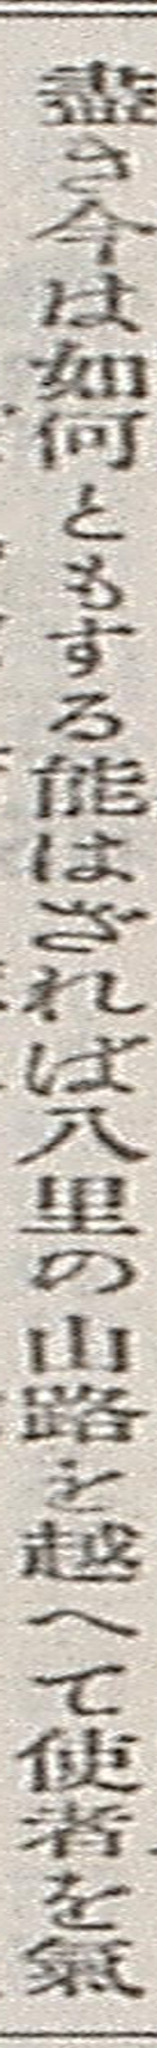尽き今は如何ともする能はざれば八里の山路を越へて使者を気
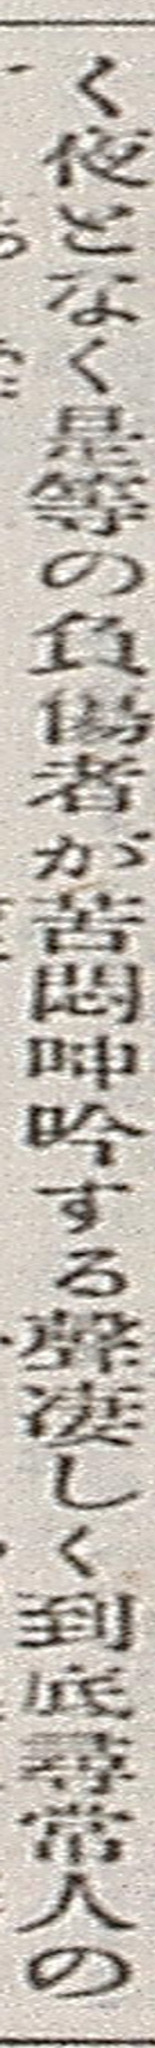く夜となく是等の負傷者が苦悶呻吟する声凄しく到底尋常人の
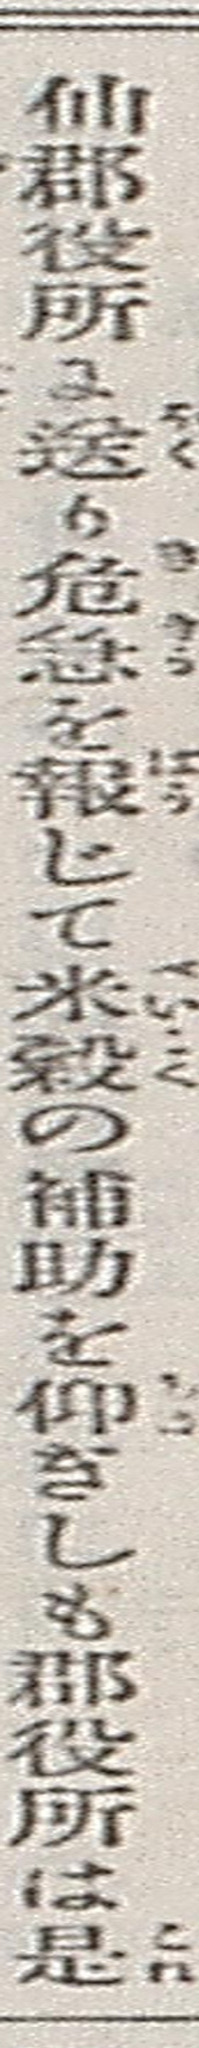仙郡役所に送り危急を報じて米穀の補助を仰ぎしも郡役所は是
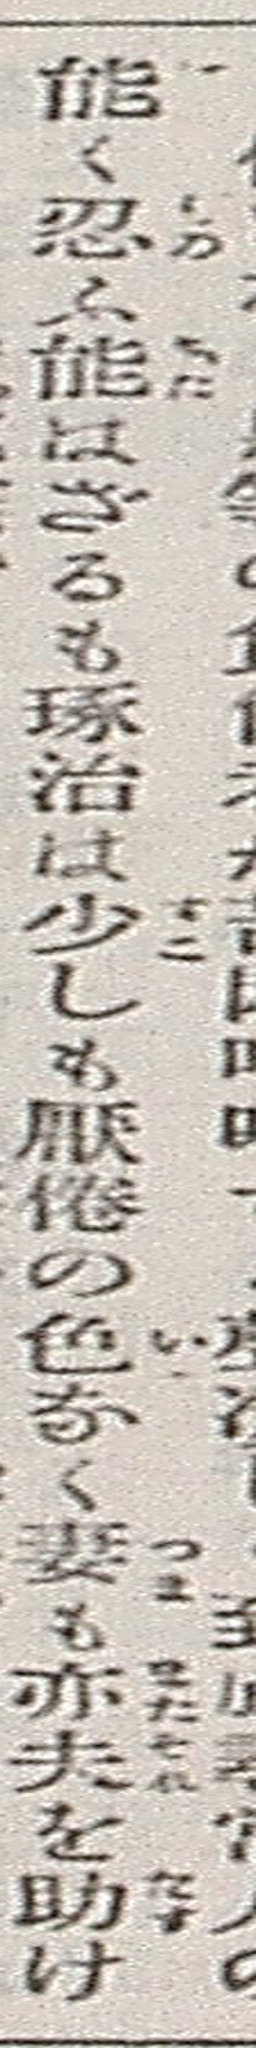能く忍ふ能はざるも琢治は少しも厭倦の色なく妻も亦夫を助け
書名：風俗畫報臨時増刊第百二十號　大海嘯被害録（下）
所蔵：東京大学地震研究所図書室 Earthquake Research Institute Library, The University of Tokyo, JAPAN
